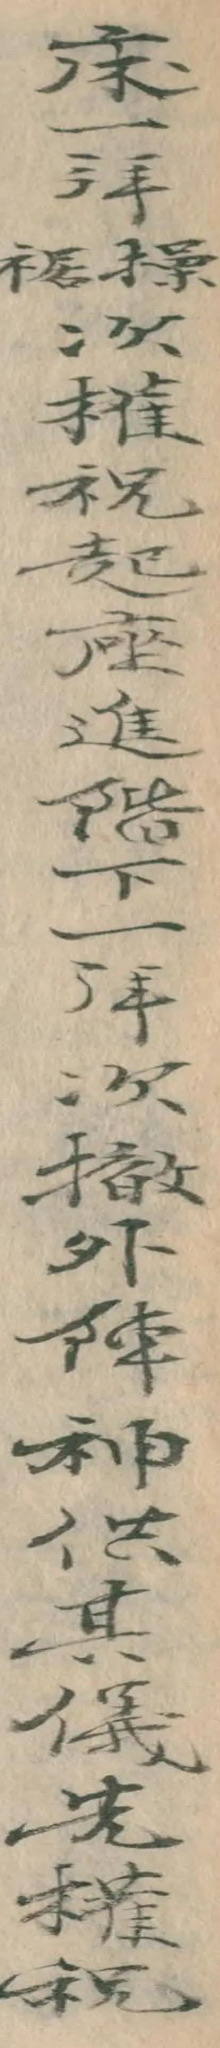床一拝操裾次権祝起座進階下一拝次撤外陣神供其儀先権祝
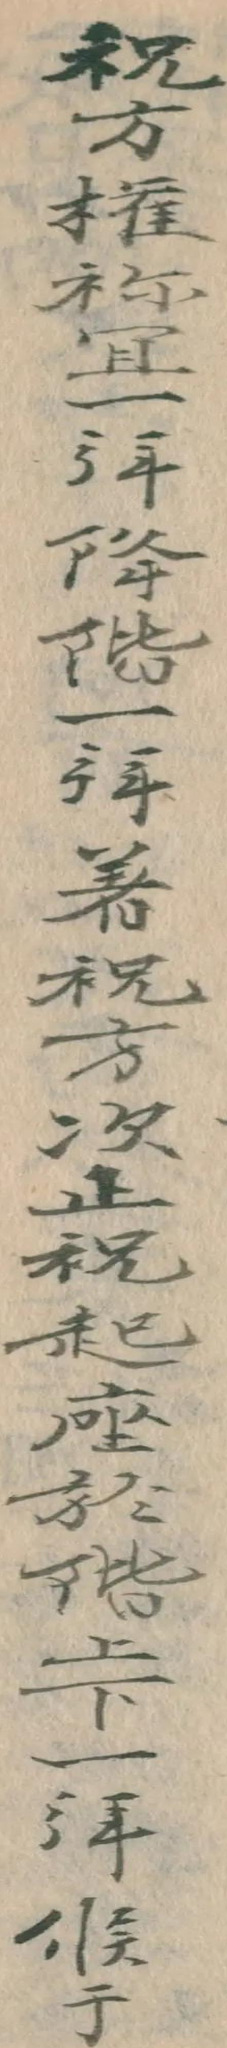祝方権祢宜一拝降階一拝着祝方次正祝起座於階上下一拝候于
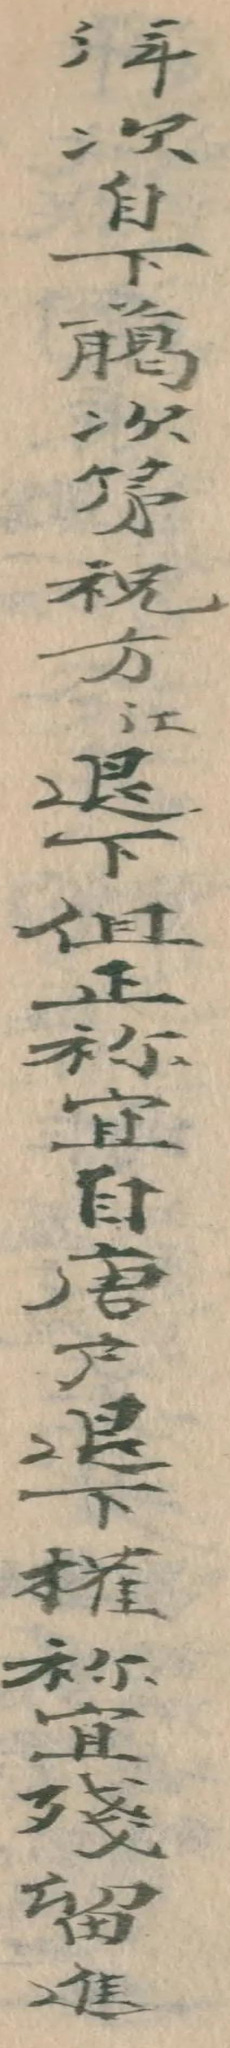拝次自下臈次第祝方江退下但正祢宜自唐戸退下権祢宜残留進
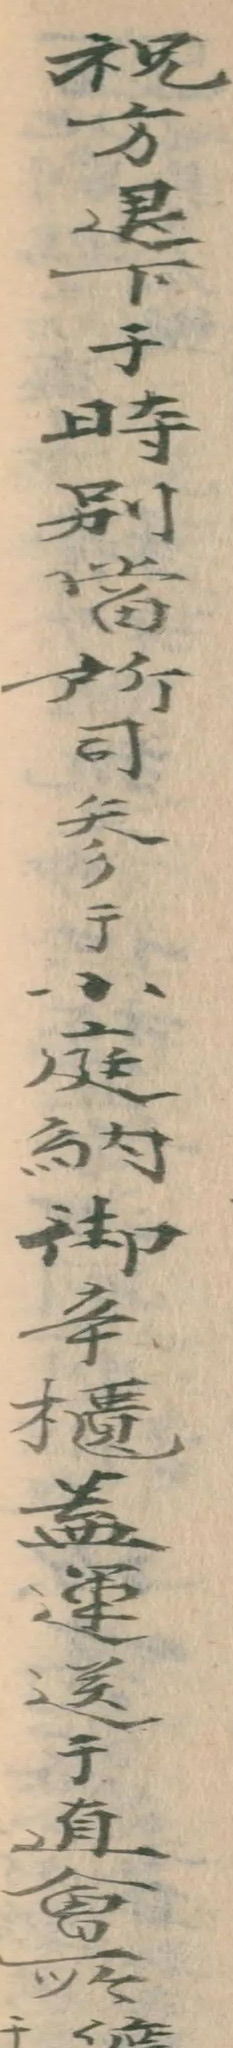祝方退下于時別当所司参于小庭納御辛櫃盖運送于直会所渡于
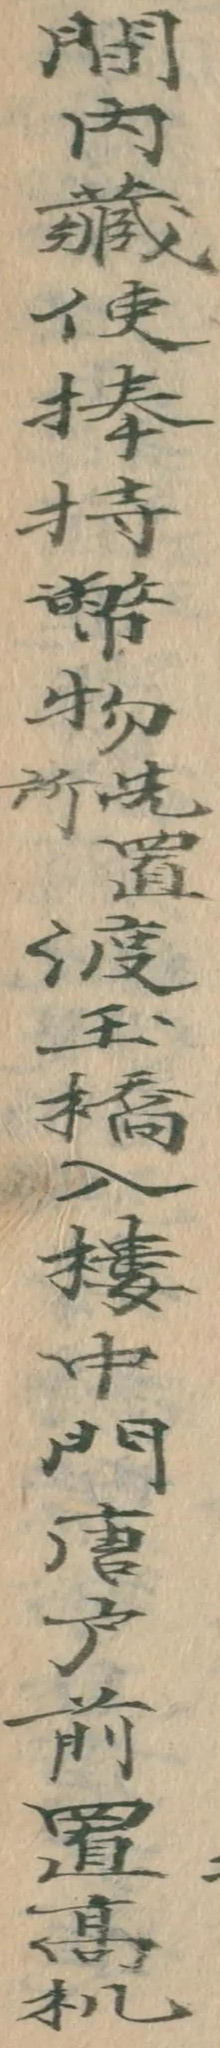間内蔵使捧持幣物先置所渡玉橋入楼中門唐戸前置高机

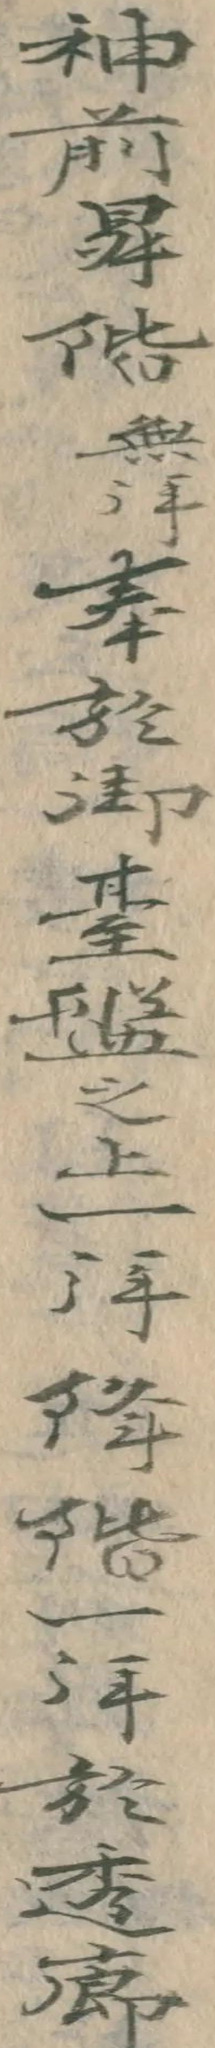神前昇階無拝奉於御台盤之上一拝降階一拝於透廊
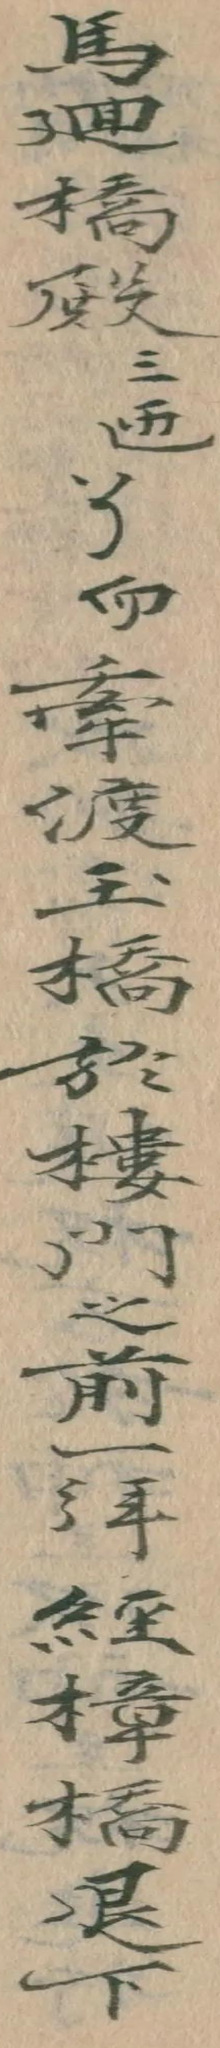馬廻橋殿三匝了而牽渡玉橋於楼門之前一拝経樟橋退下

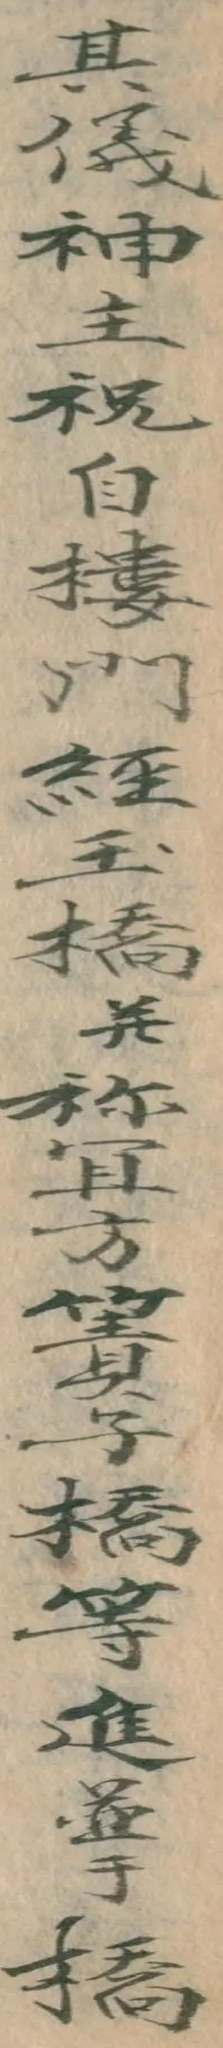其儀神主祝自楼門経玉橋并祢宜方簀子橋等進並于橋
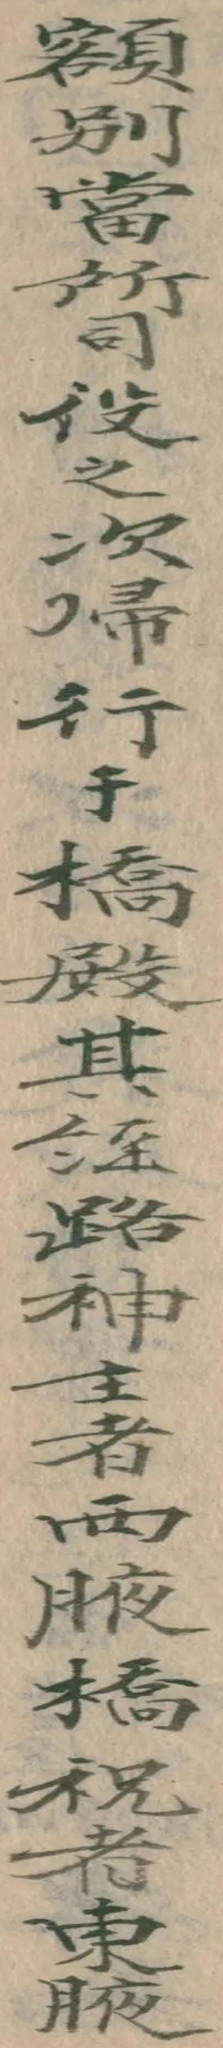額別当所司役之次帰行于橋殿其経路神主者西腋橋祝者東腋
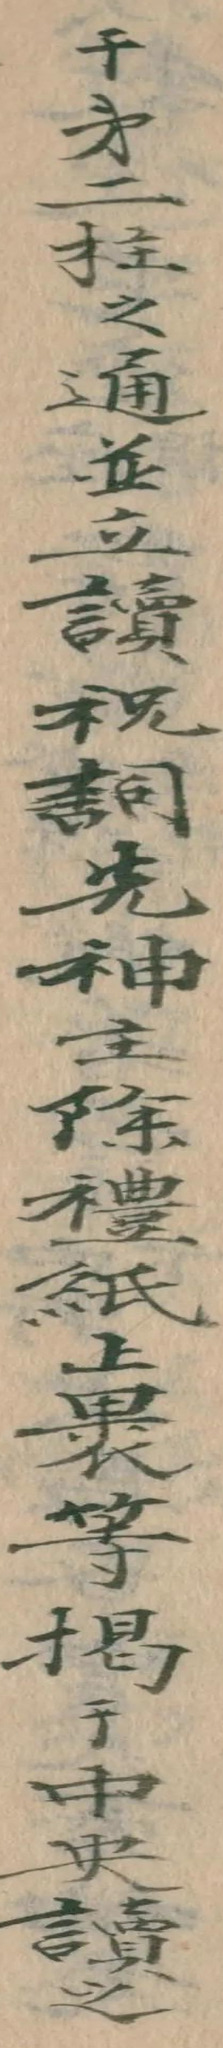于第二柱之通並立読祝詞先神主除礼紙上褁等掲于中央読之
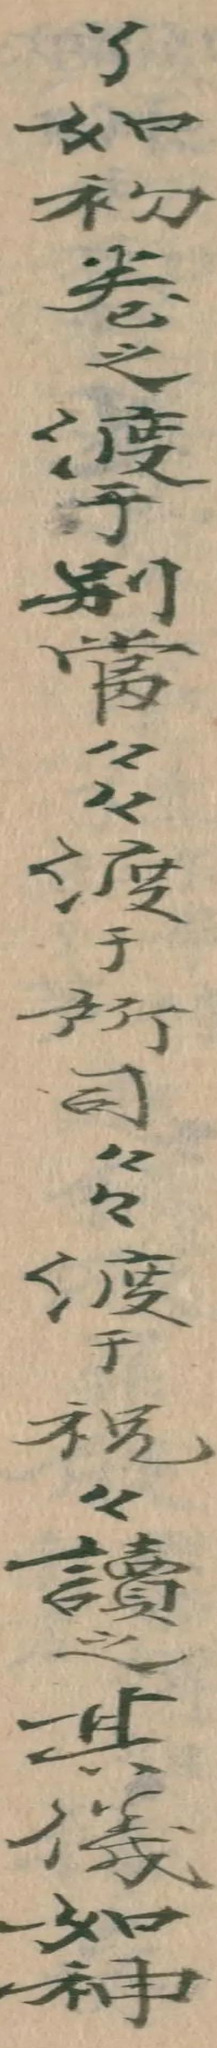了如初巻之渡于別当々々渡于所司々々渡于祝々読之其儀如神
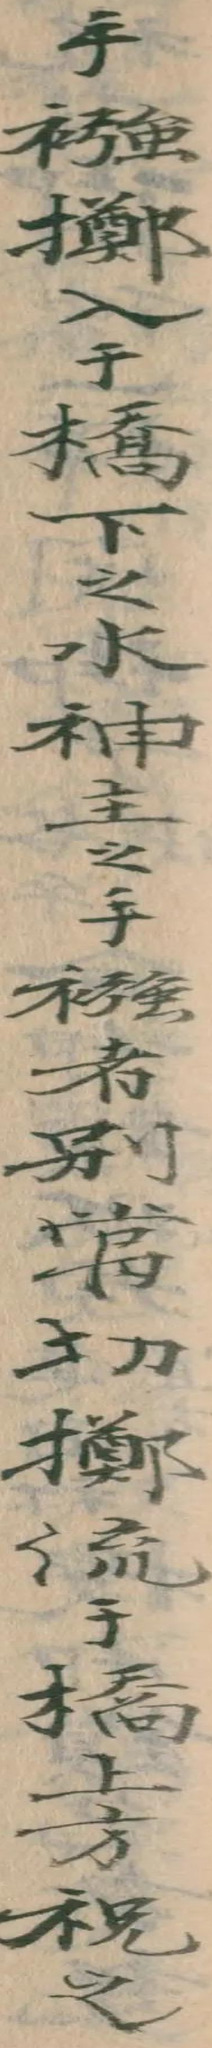手襁擲入于橋下之水神主之手襁者別当切擲流于橋上方祝之
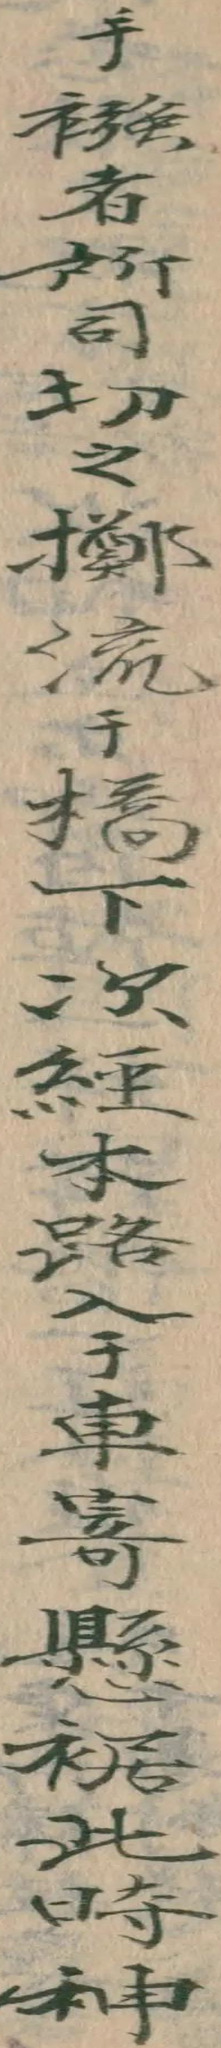手襁者所司切之擲流于橋下次経本路入于車寄懸裾此時神
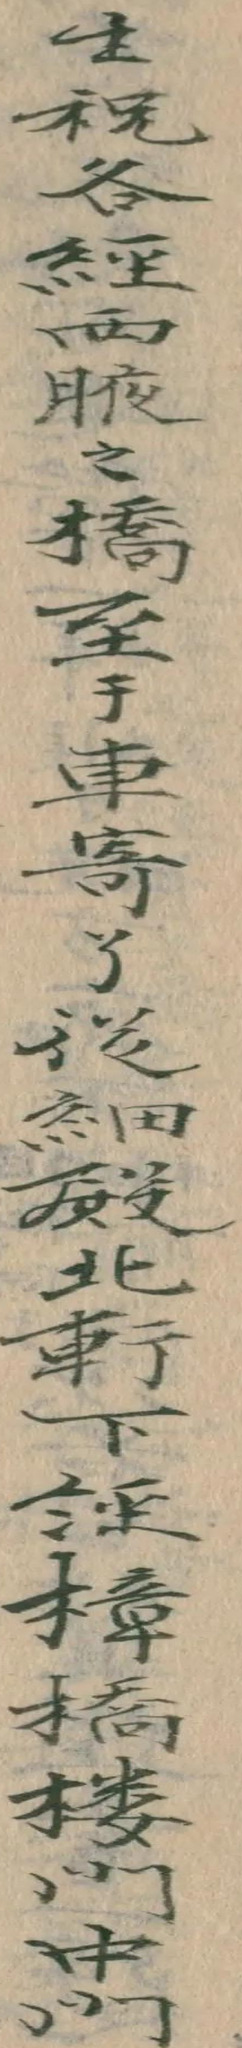主祝各経西腋之橋至于車寄了従細殿北軒下経樟橋楼門中門
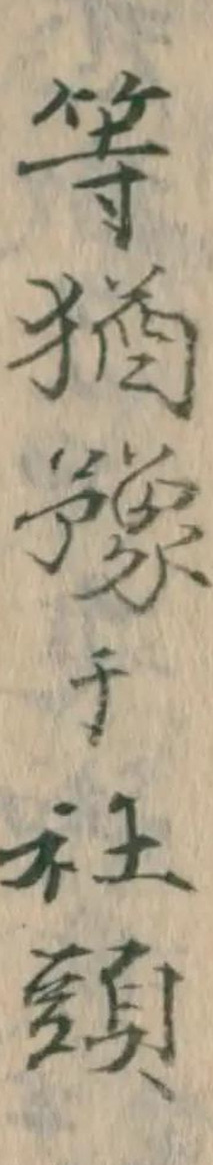等猶予于社頭
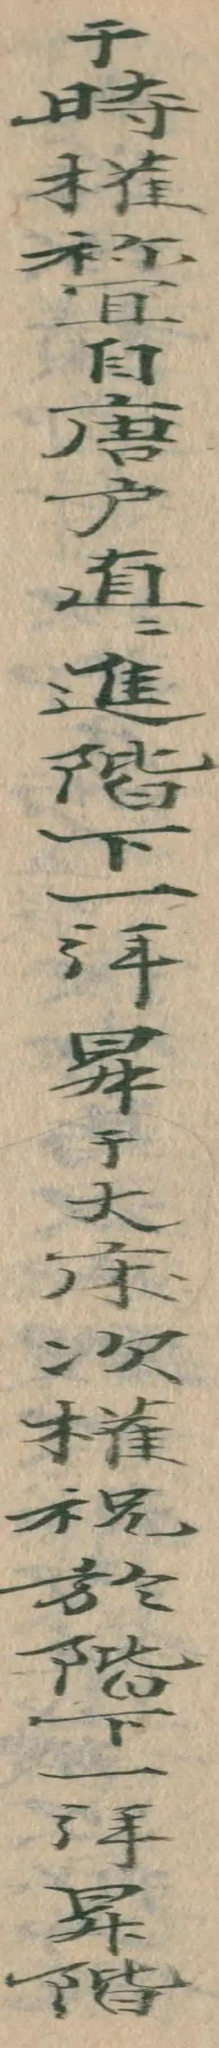于時権祢宜自唐戸直ニ進階下一拝昇于大床次権祝於階下一拝昇階
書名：賀茂社記録. 第9冊
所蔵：国立国会図書館 National Diet Library, JAPAN
